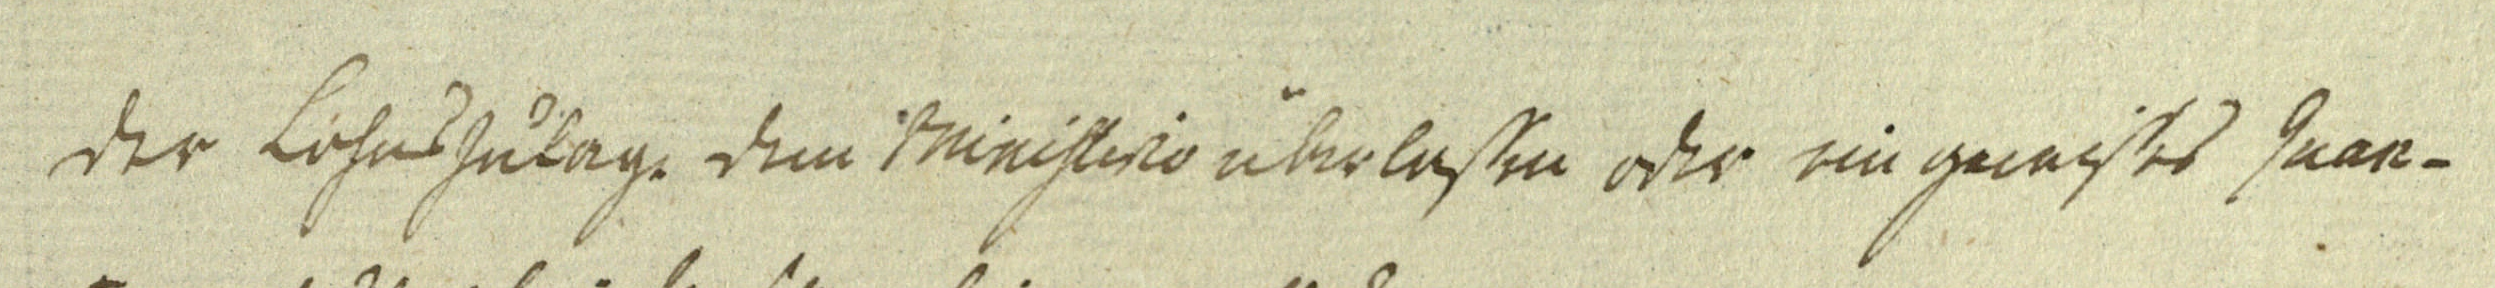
der Lohnszulage dem Ministerio überlassen oder ein gewisses Quan¬
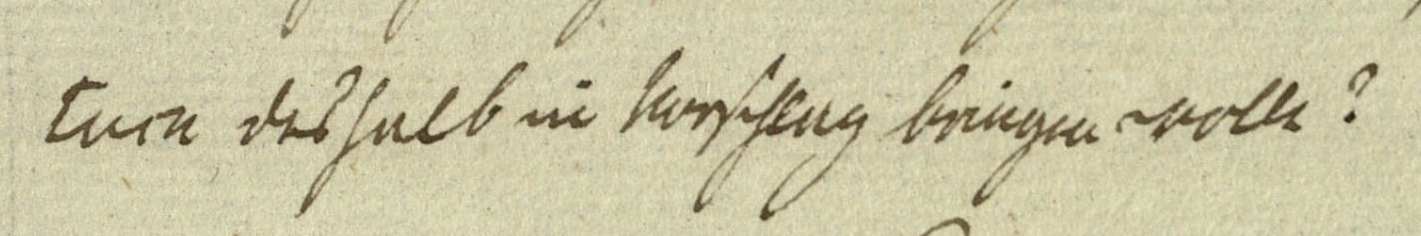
tum deshalb in Vorschlag bringen wolle?
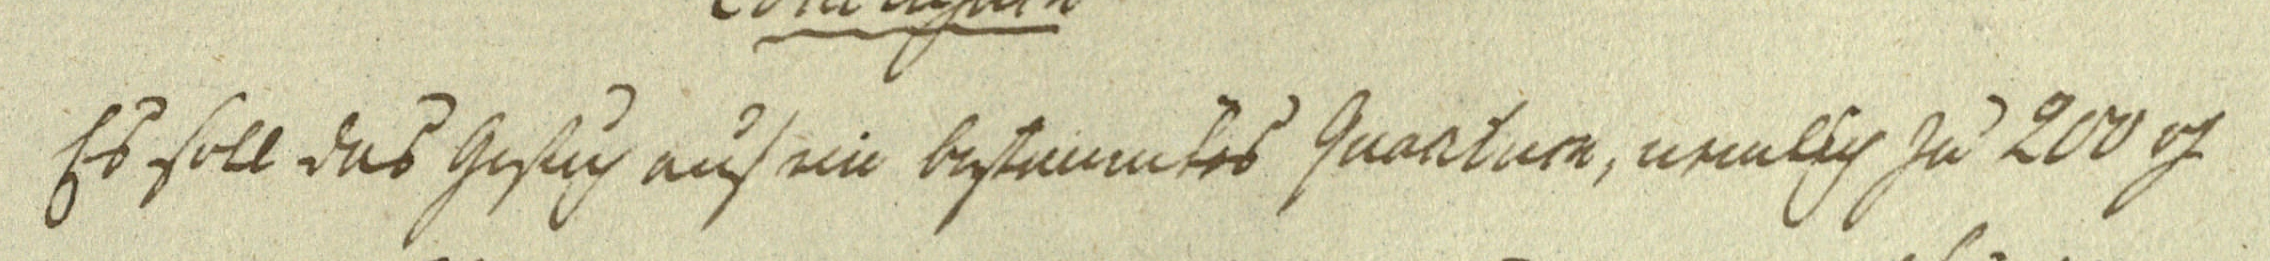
Es soll das Gesuch auf ein bestimmtes Quantum, nemlich zu 200 rt
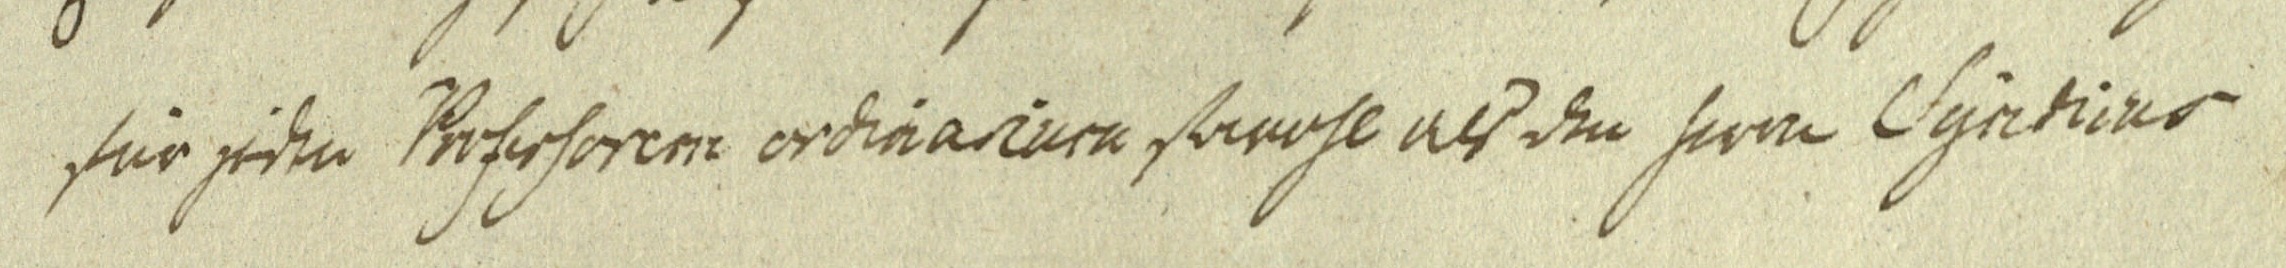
für jeden Professorem ordinarium sowohl als den Herrn Sÿndicus
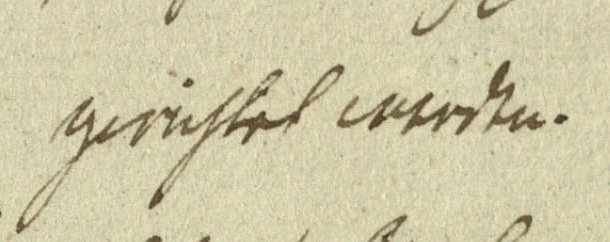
gerichtet werden.
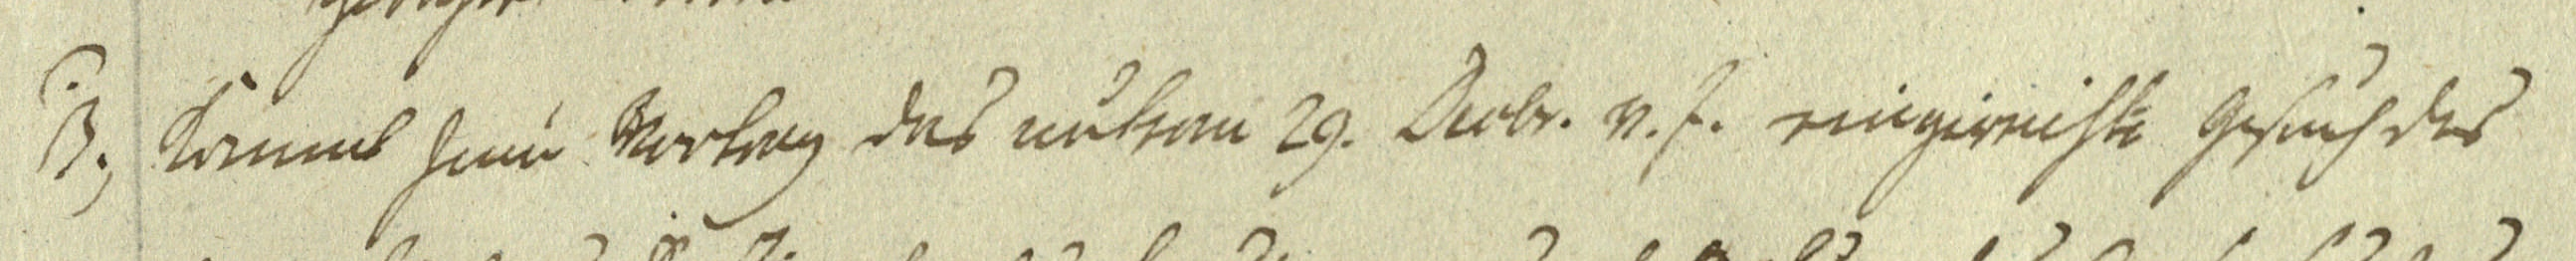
3. Kommt zum Vortrag das unterm 29. Decbr. v. J. eingereichte Gesuch des
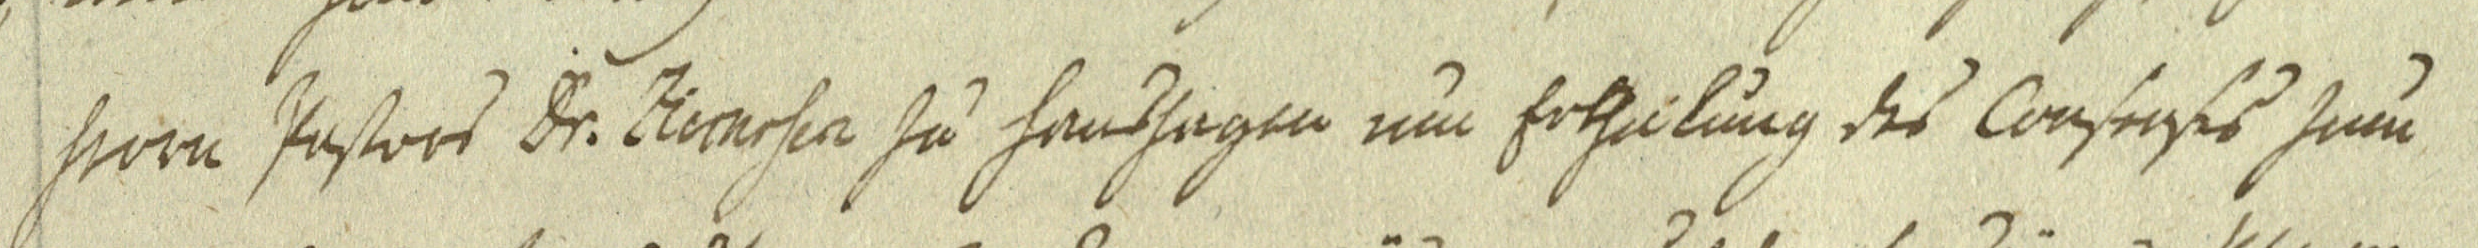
Herrn Pastors Dr. Ziemssen zu Hanshagen um Ertheilung des Consenses zum
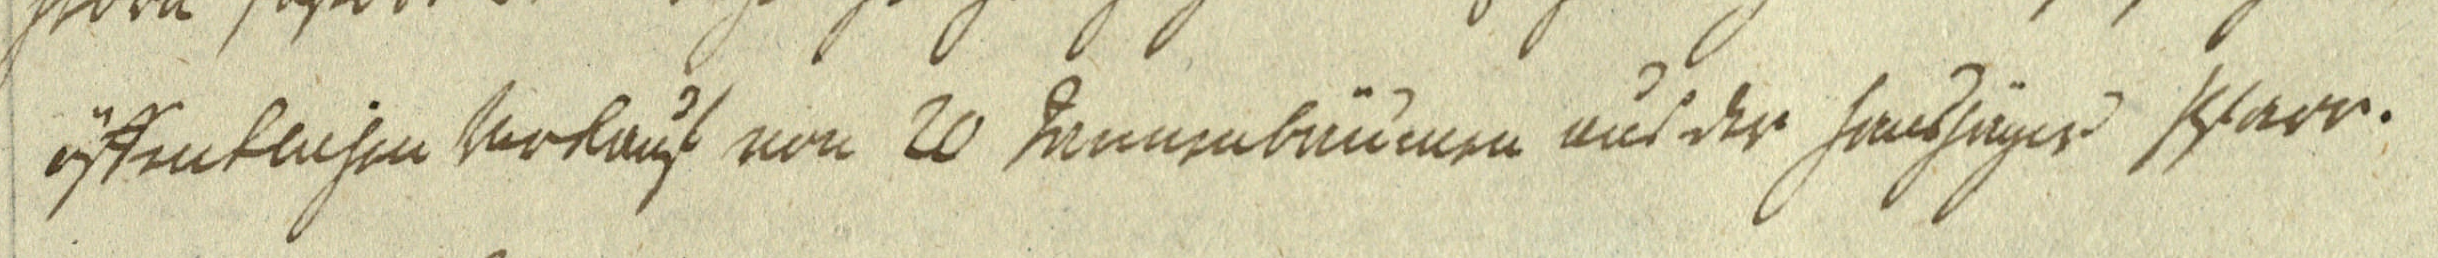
öffentlichen Verkauf von 20 Tannenbäumen aus der Hanshäger Pfarr¬
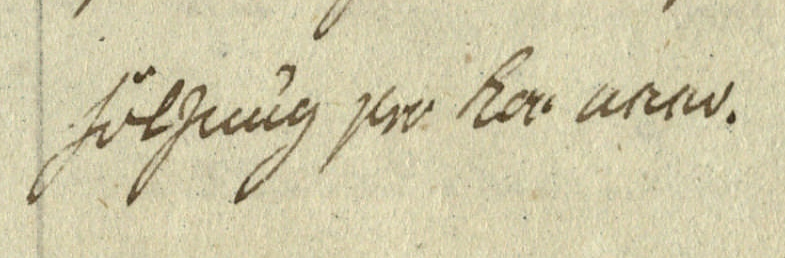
hölzung pro hoc anno.
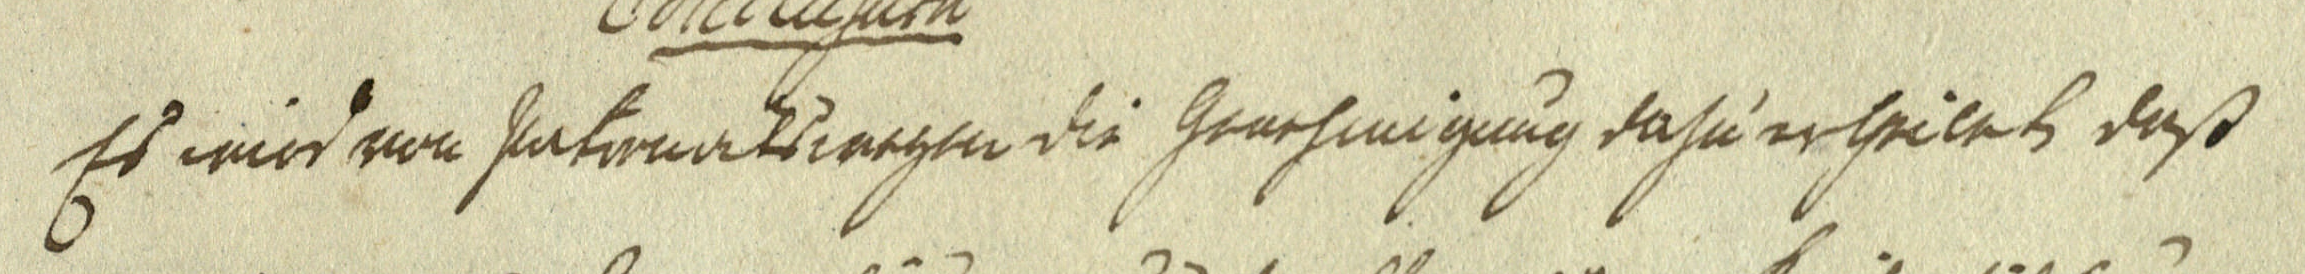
Es wird von Patronatswegen die Genehmigung dazu ertheilet, daß
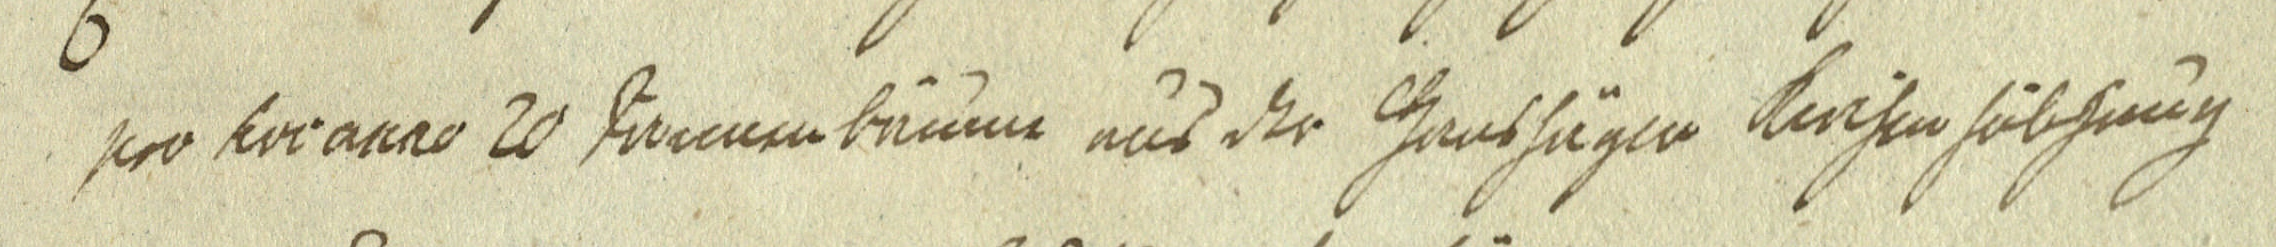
pro hoc anno 20 Tannenbäume aus der Hanshäger Kirchenhölzung
